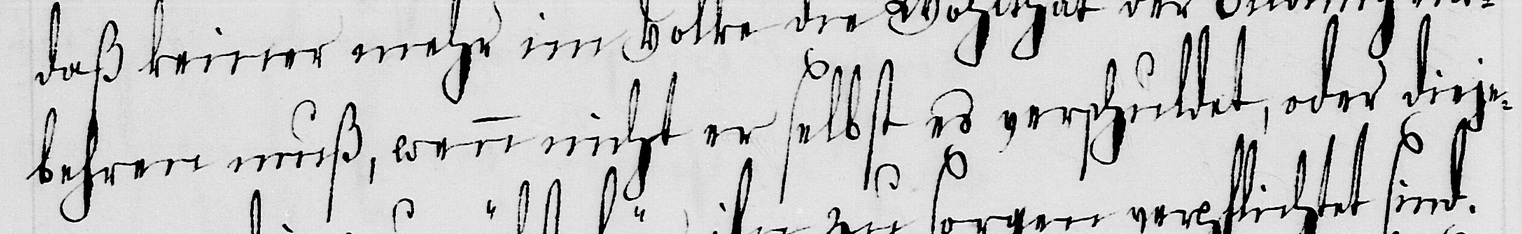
behren muß, wenn nicht er selbst es verschuldet, oder dieje¬
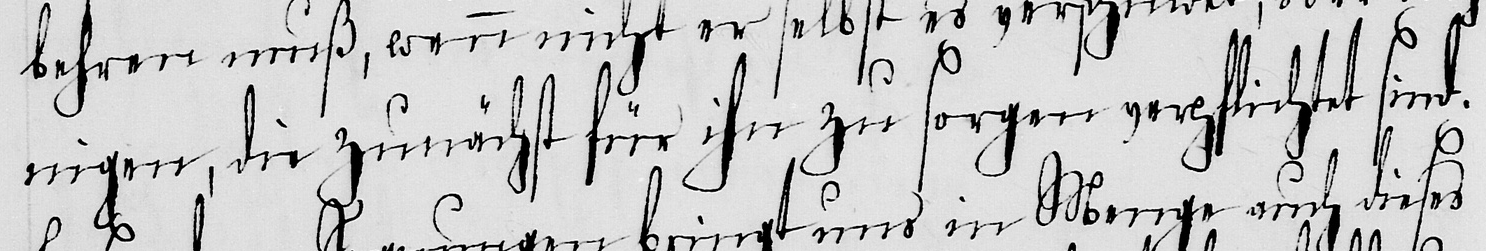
nigen, die zunächst für ihn zu sorgen verpflichtet sind.
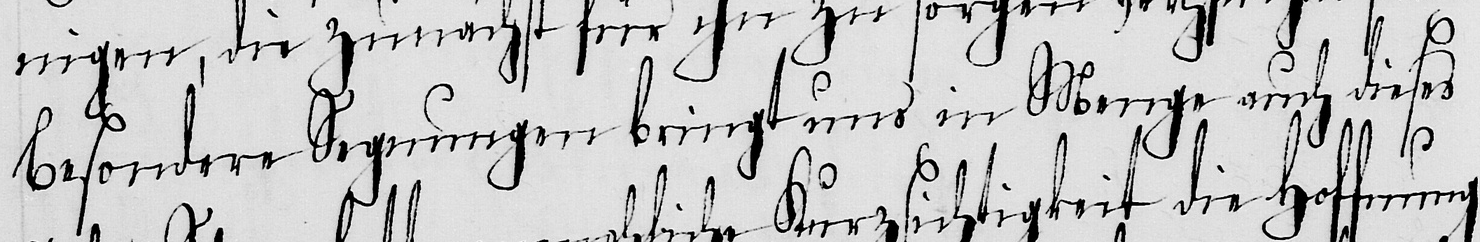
Besondere Segnungen bringt uns in Menge auch dieses
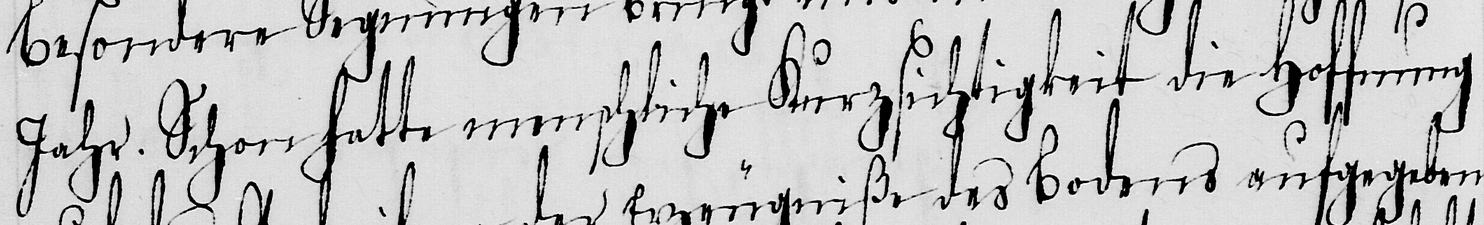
Jahr. Schon hatte menschliche Kurzsichtigkeit die Hoffnung
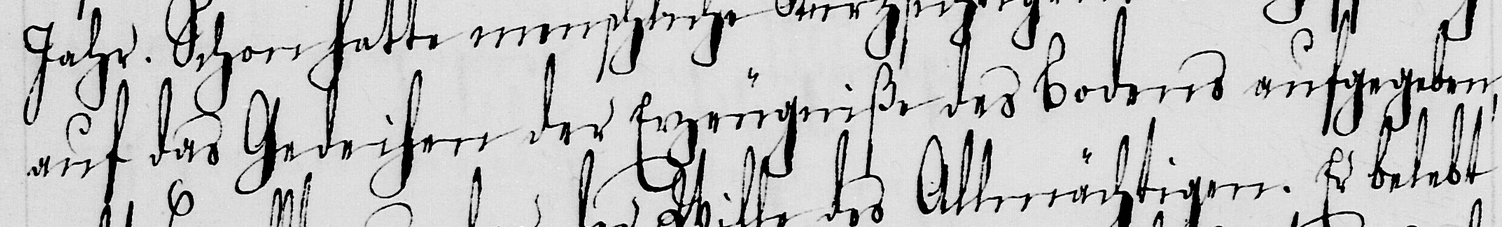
auf das Gedeihen der Erzeugniße des Bodens aufgegeben,
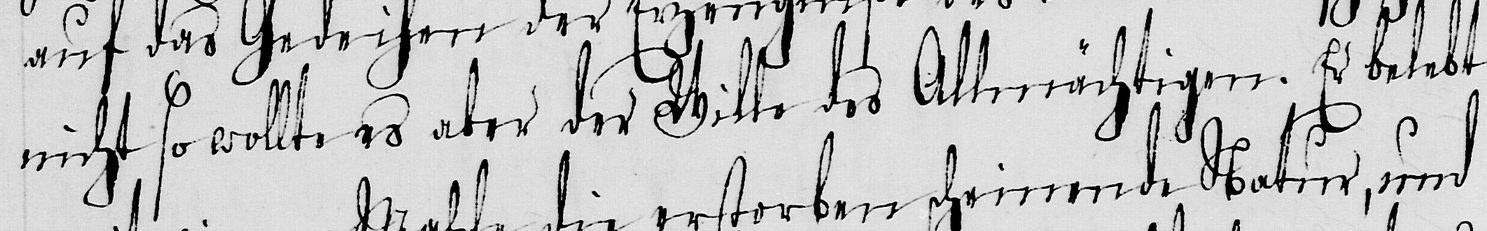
nicht so wollte es aber der Wille des Allmächtigen. Er belebt
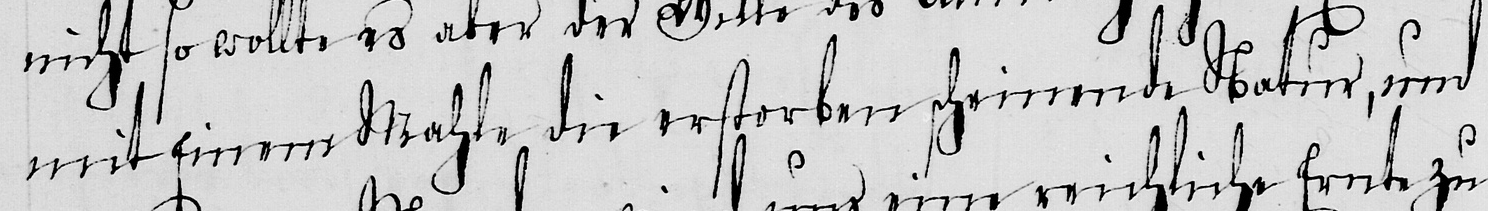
mit Einem Mahle die erstorben scheinende Natur, und
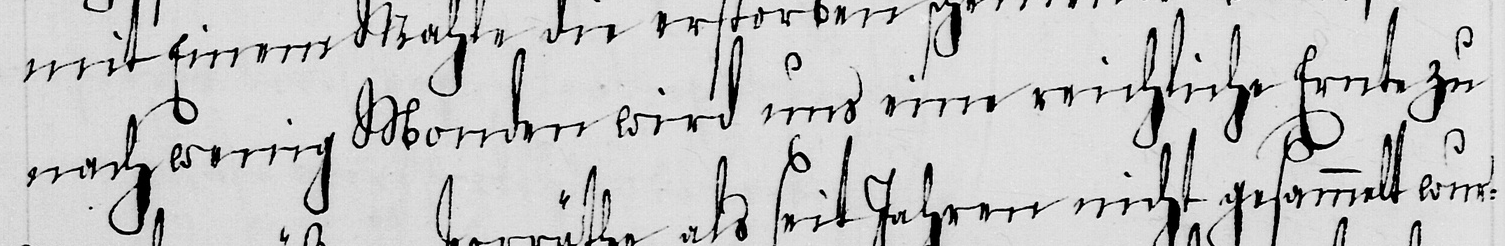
nach wenig Monden wird uns eine reichliche Ernte zu
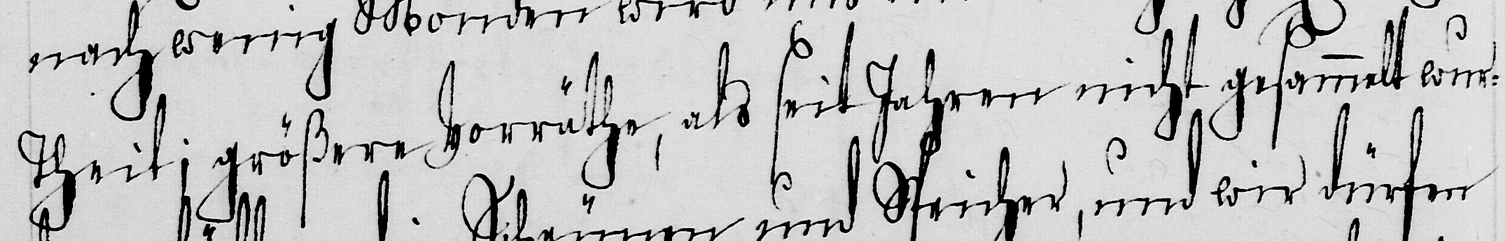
Theil; größere Vorräthe, als seit Jahren nicht gesammelt wu¬
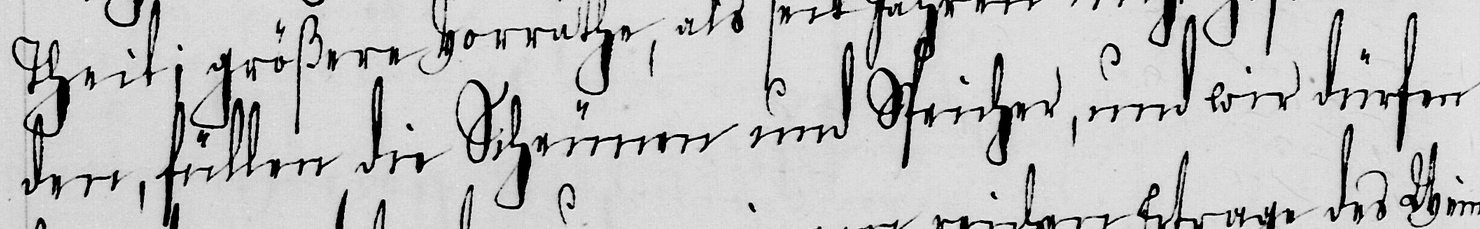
rden, füllen die Scheunen und Speicher, und wir dürfen
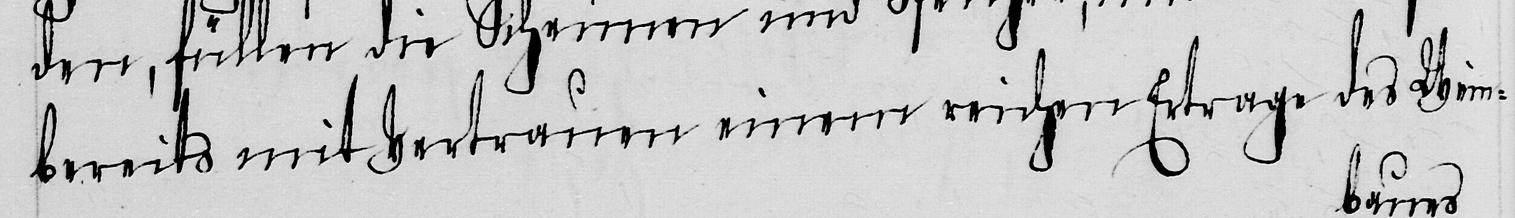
bereits mit Vertrauen einem reichen Ertrage des Wein-
